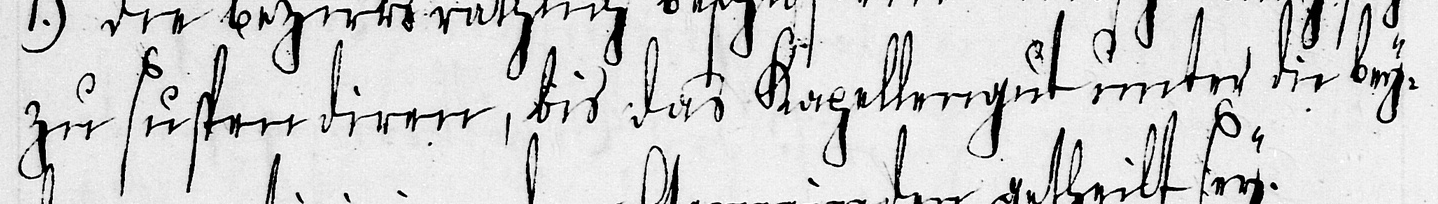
zu suspendiren, bis das Kapellengut unter die bey¬
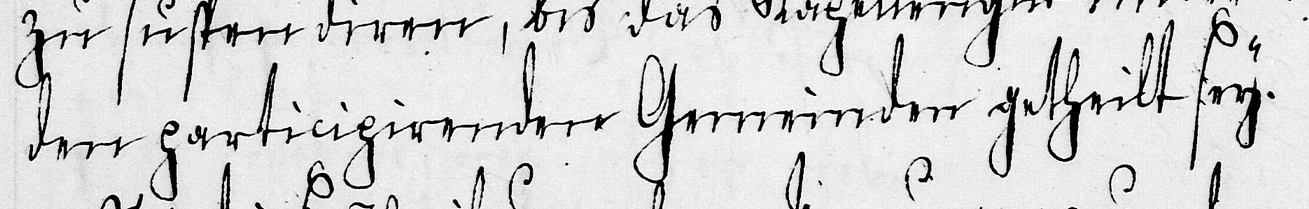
den participirenden Gemeinden getheilt sey.
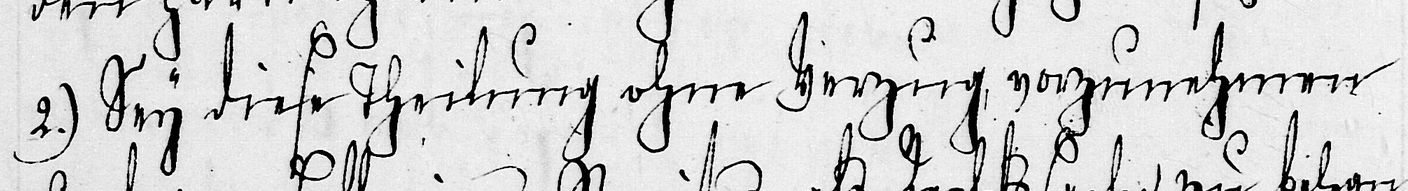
2.) Sey diese Theilung ohne Verzug vorzunehmen
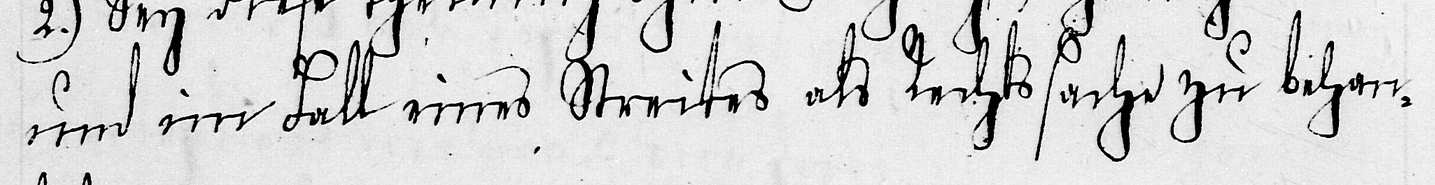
und im Fall eines Streites als Rechtssache zu behan¬
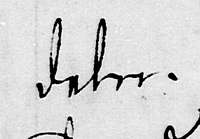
deln.
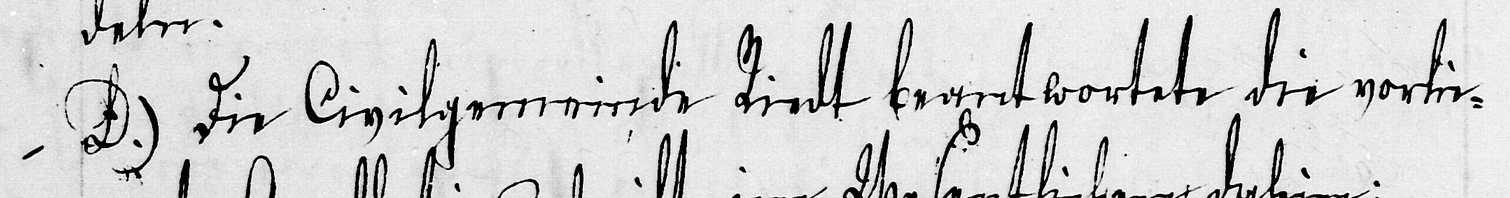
D.) Die Civilgemeinde Riedt beantwortete die vorlie¬
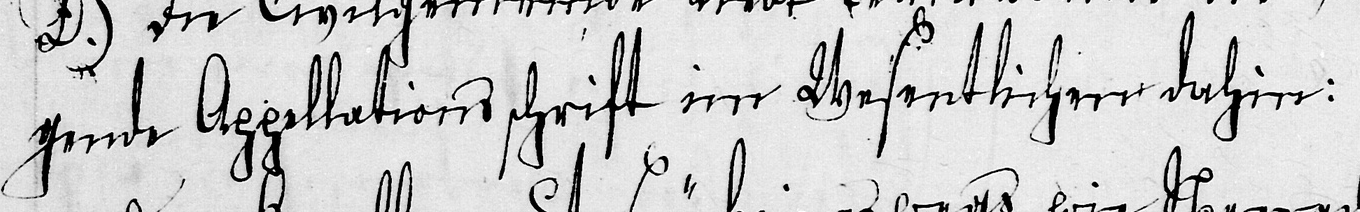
gende Appellationsschrift im Wesentlichen dahin:
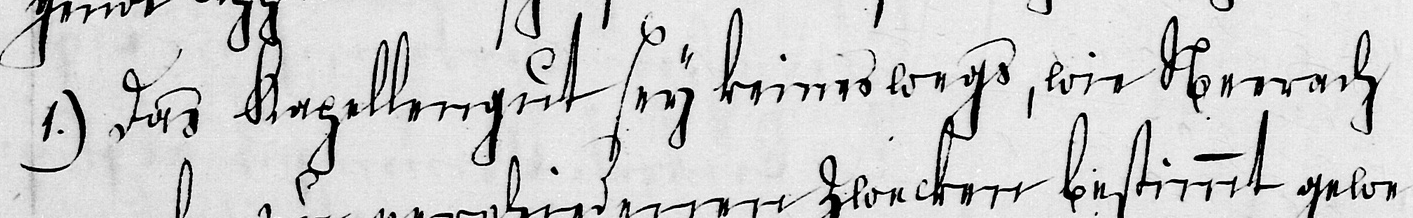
1.) Das Kapellengut sey keineswegs, wie Neerach
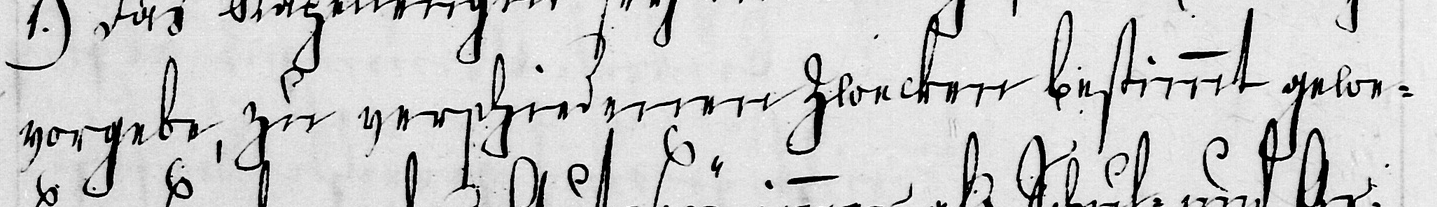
vorgebe, zu verschiedenen Zwecken bestimmt gewe¬
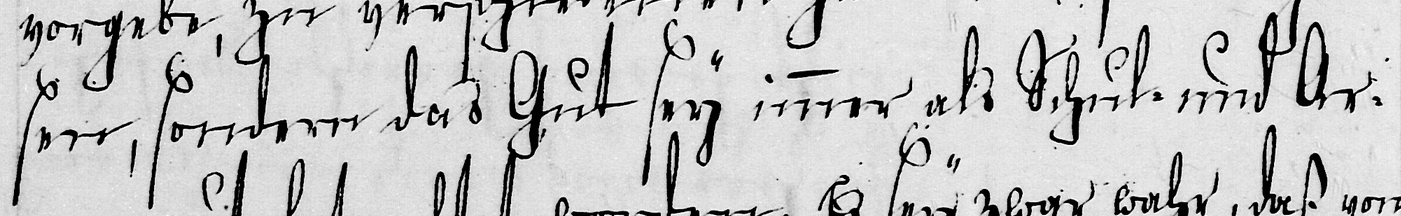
sen, sondern das Gut sey immer als Schul- und Ar¬
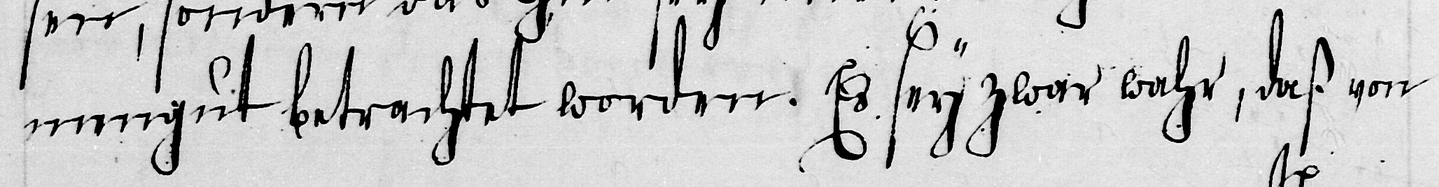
mengut betrachtet worden. Es sey zwar wahr, daß von
